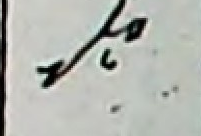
do
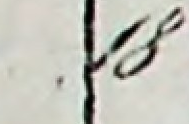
18
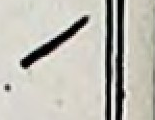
1
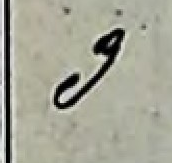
3
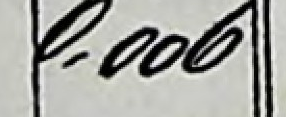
0,006
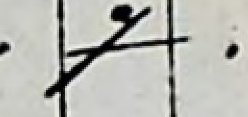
7
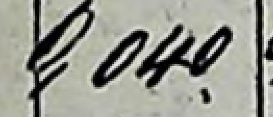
0,040
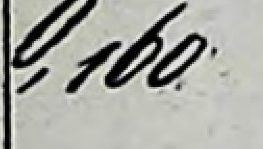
0,160
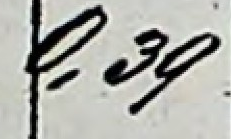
0,39
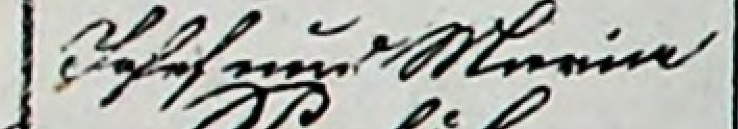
Josef und Maria
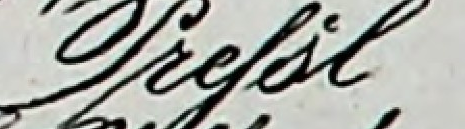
Pressl
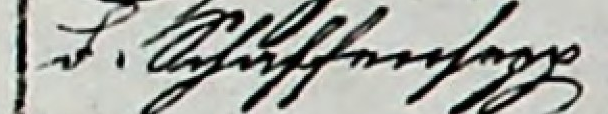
v. Schaffenlepp
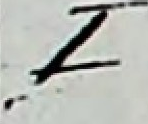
I
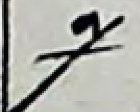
7
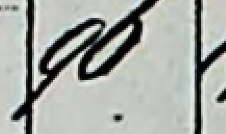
96
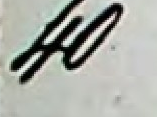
40
